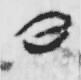日
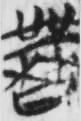○（許）
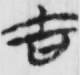吉
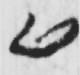㠯（以）
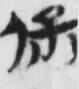保
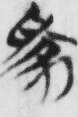○（家）
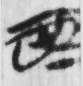爲
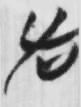左
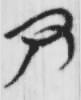尹
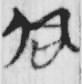卲
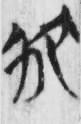{力它}
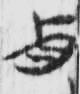貞
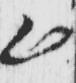㠯（以）
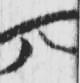亓（其）
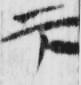下
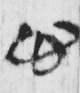心
